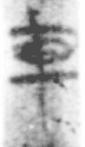車
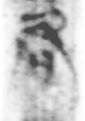君
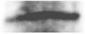一
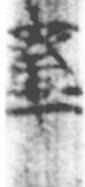𨍱（乘）
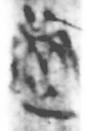○（鲁）
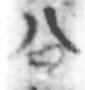公
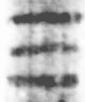三
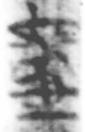𨍱（乘）
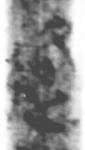○（路）
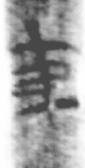車
